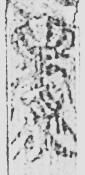{興頁分}
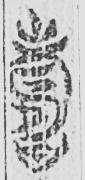壽
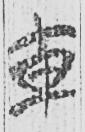車
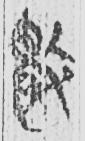{睘攴}
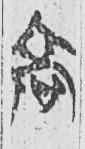高
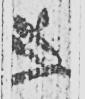之
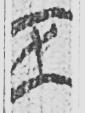巨
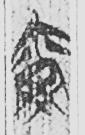爾
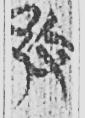改
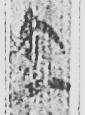立
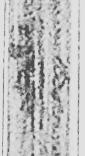{木𦥑}
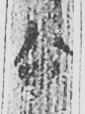公
